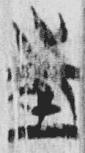市
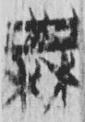無
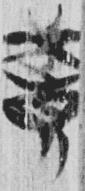賦
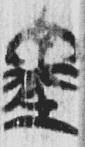○（禹）
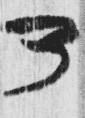乃
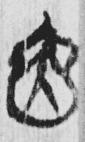因
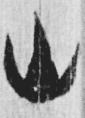山
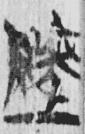陵
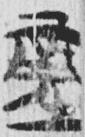坪（平）
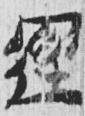○（隰）
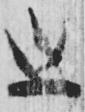之
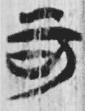可
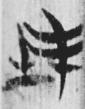封
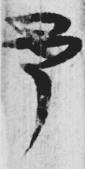邑
